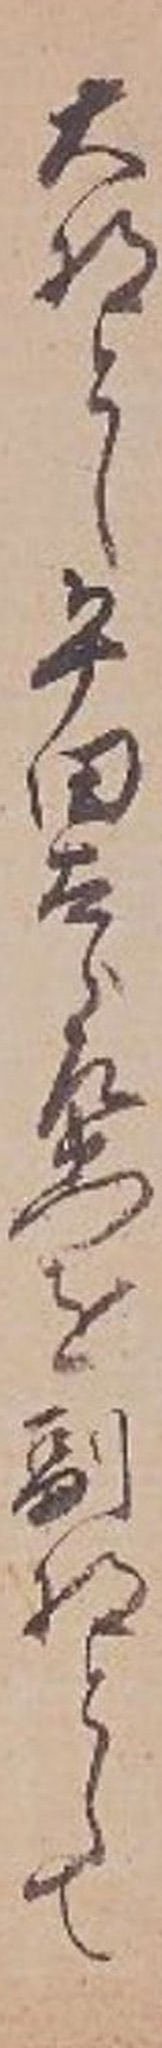大将とし平田太郎左衛門を副将として
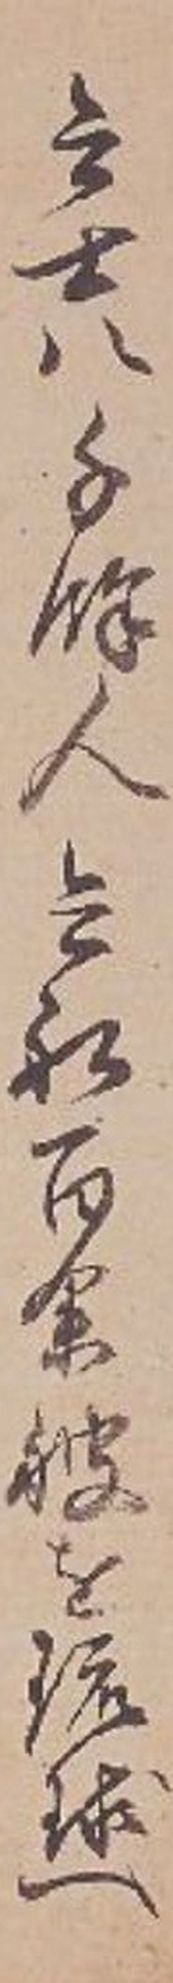兵士八千余人兵船百余艘を琉球へ
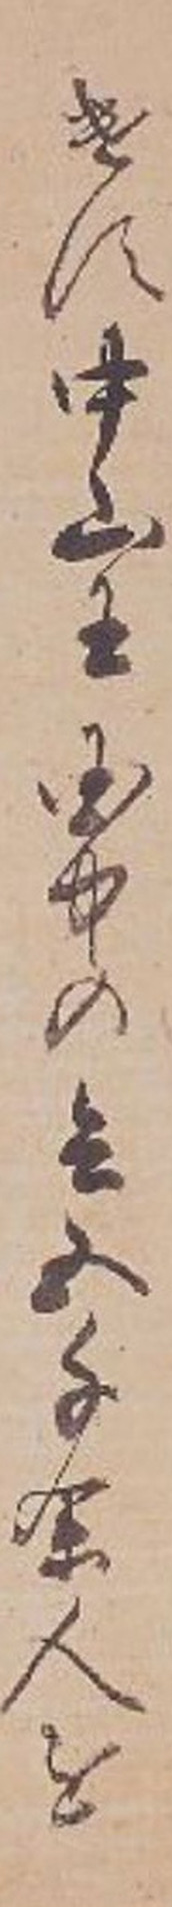遣す中山王国中の兵五千余人を
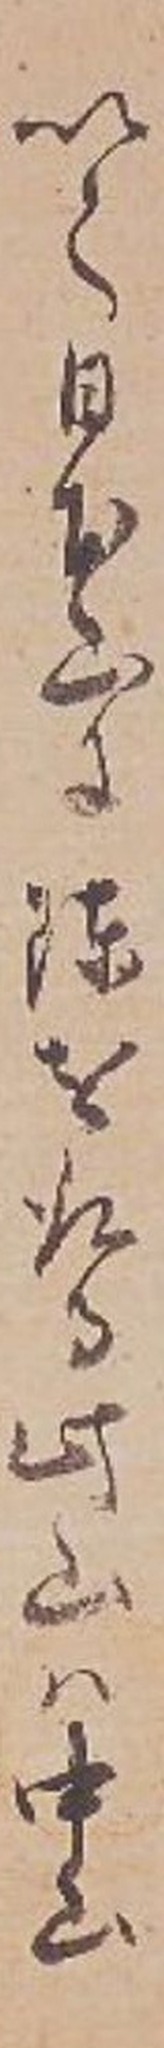以て日本山に陣を取る此山ハ中山
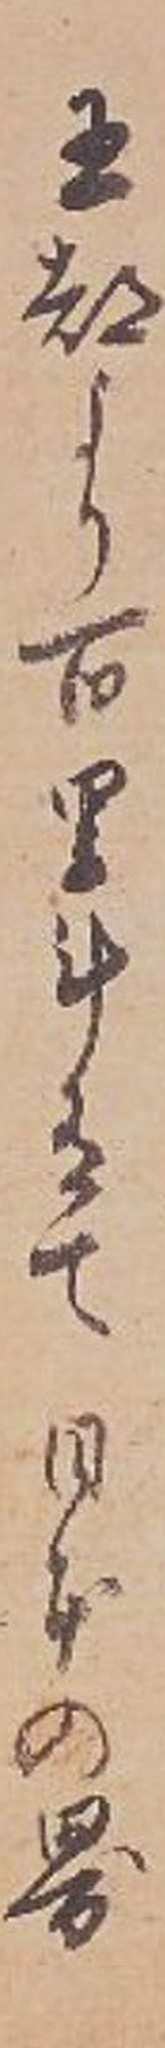王都より百里計有て日本の界
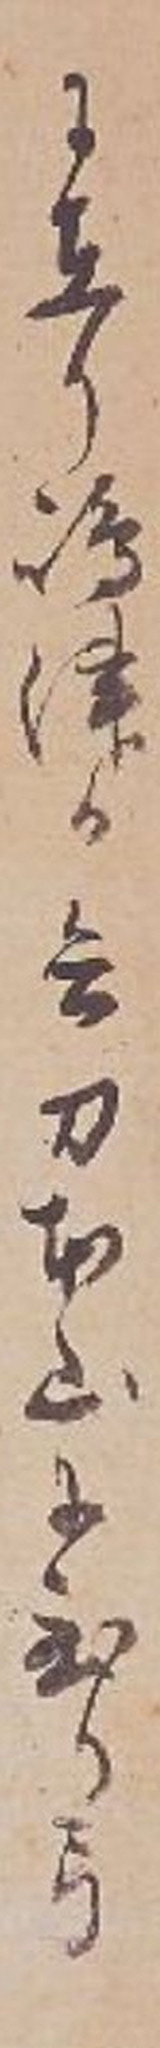に在り嶋津か兵刀本山に至り弓
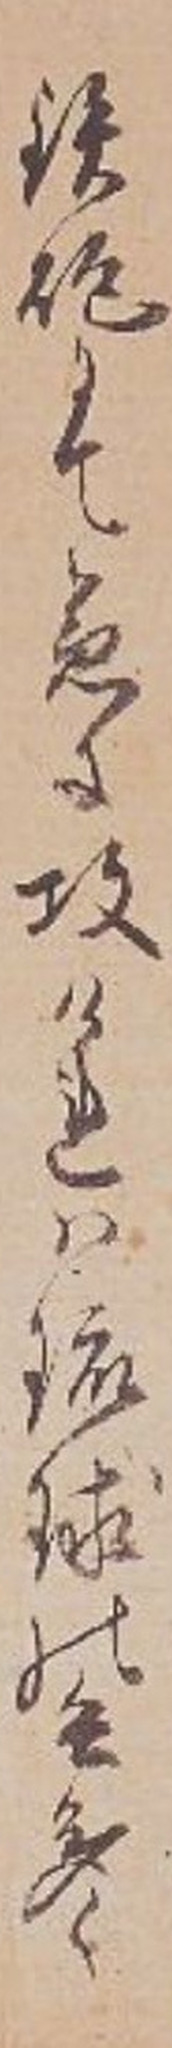鉄砲にて急に攻けれハ琉球の兵多く
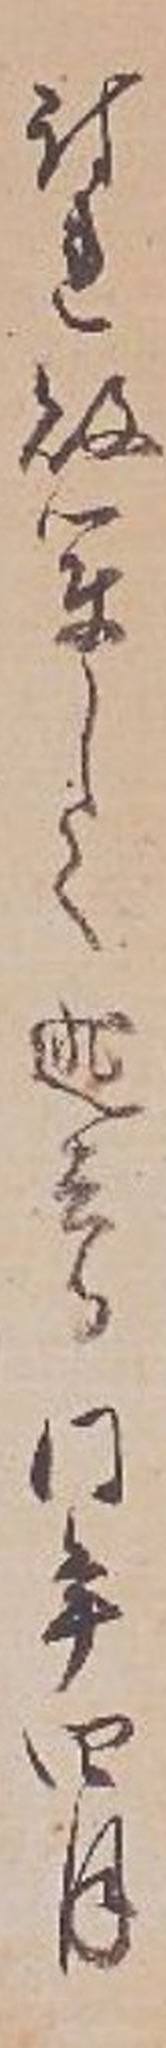討れ敗軍して逃去る同年四月
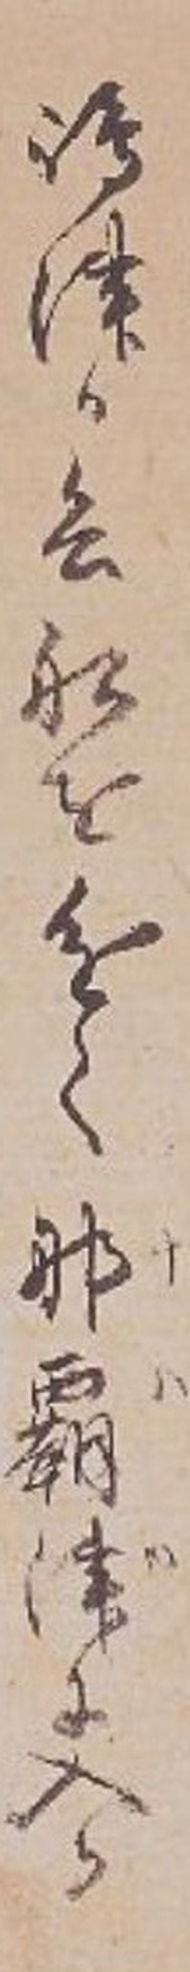嶋津か兵船を進て那覇津に入り
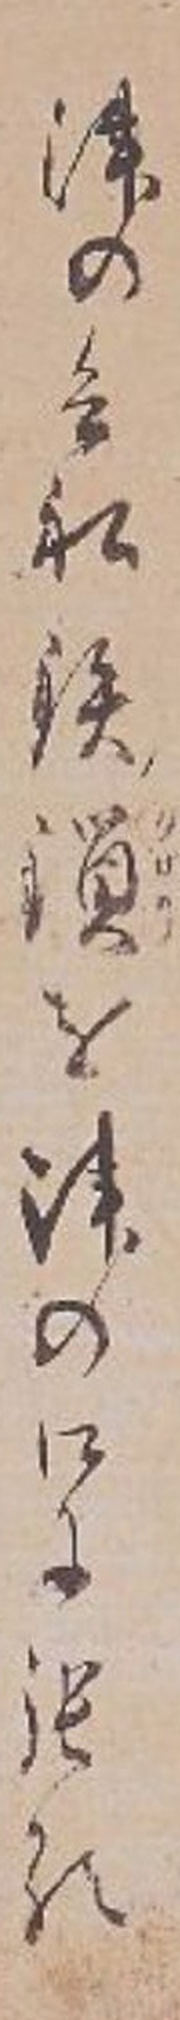津の兵船鉄ノ鎖を津の口に張る
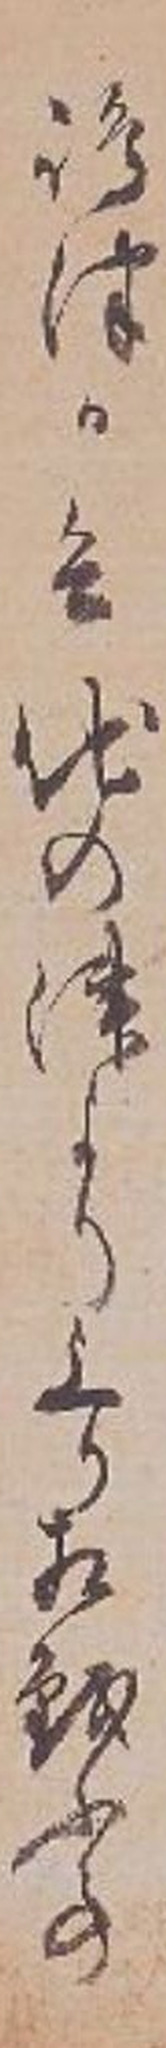嶋津か兵他の津より上り相戦ふ事

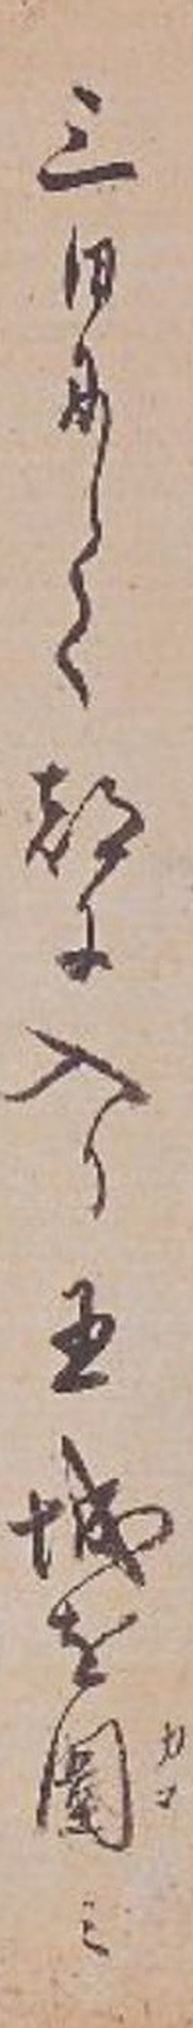三日にて都に入り王城を囲ミ
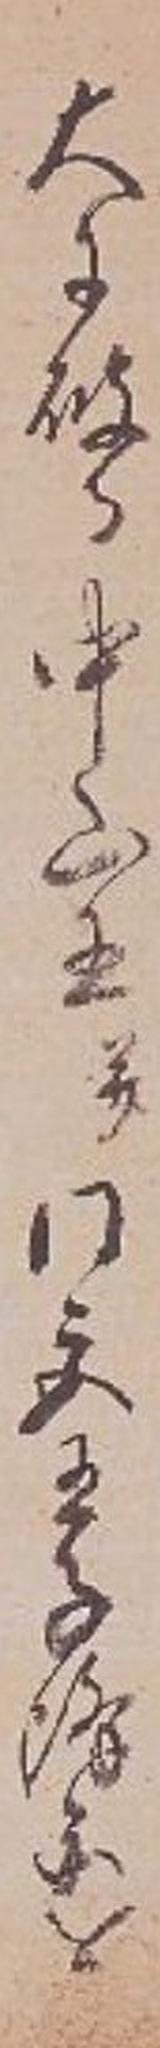大に破る中山王幷同宮王子降参を
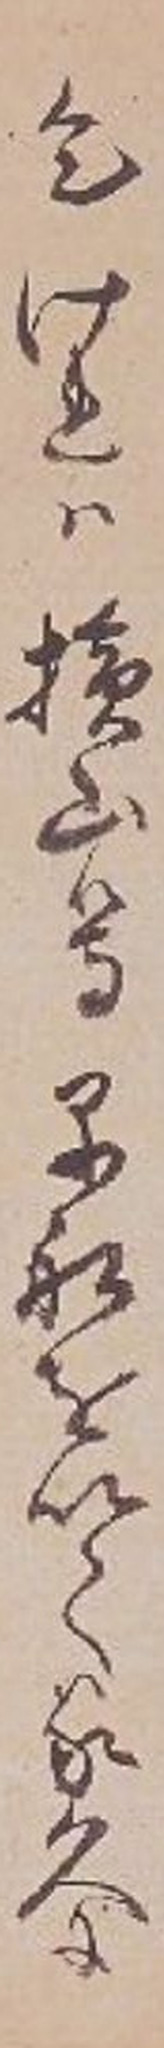乞けれハ樺山等早船を以て家久に
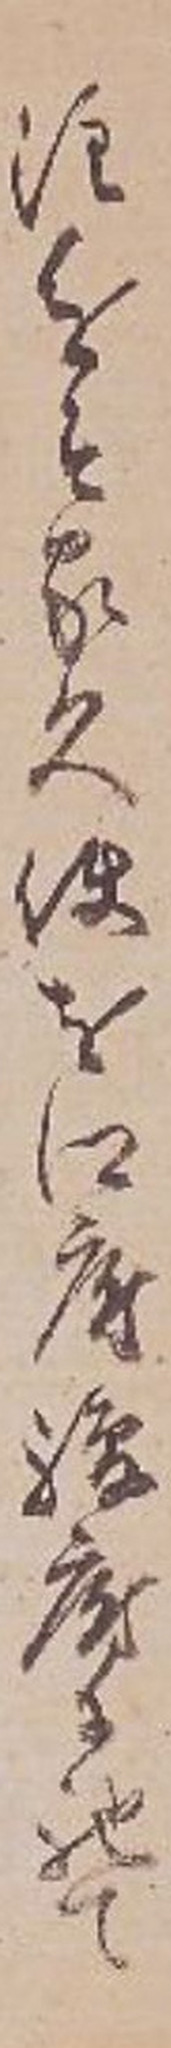注進す家久使を江府駿府に馳て
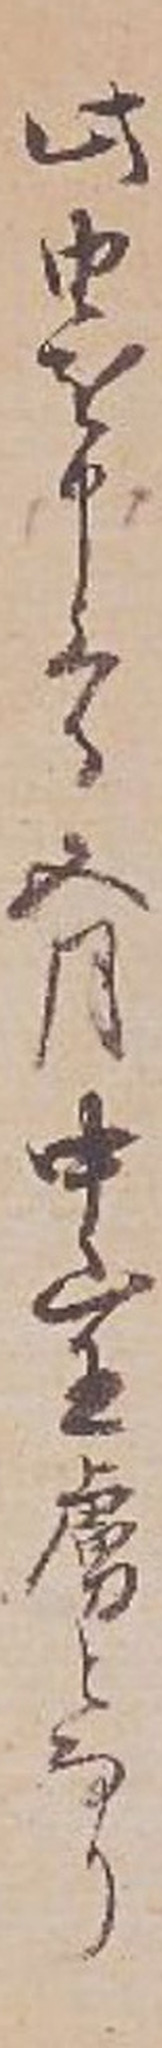此由申上る五月中山王虜となり
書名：琉球人来朝記 一、二
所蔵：University of the Ryukyus Library
